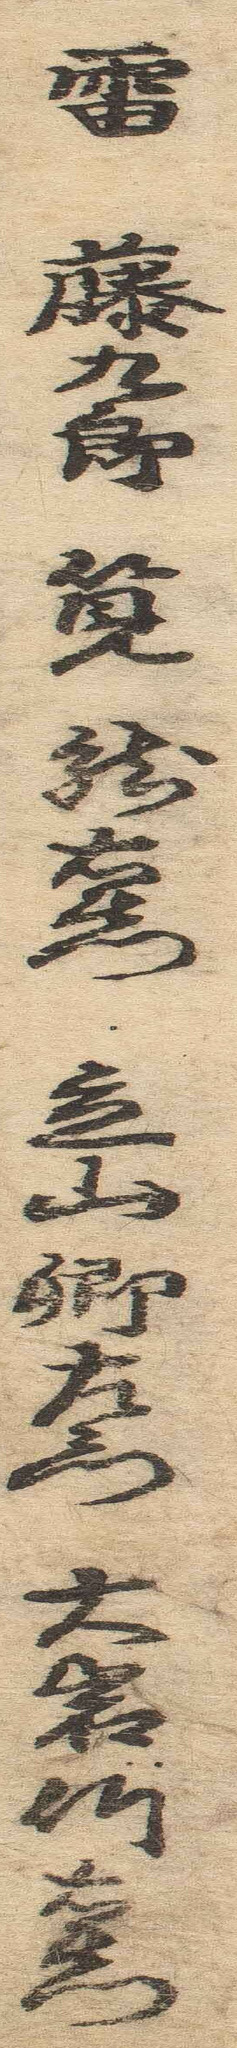雷藤九郎筧龍右衛門立山郷左衛門大岩竹右衛門
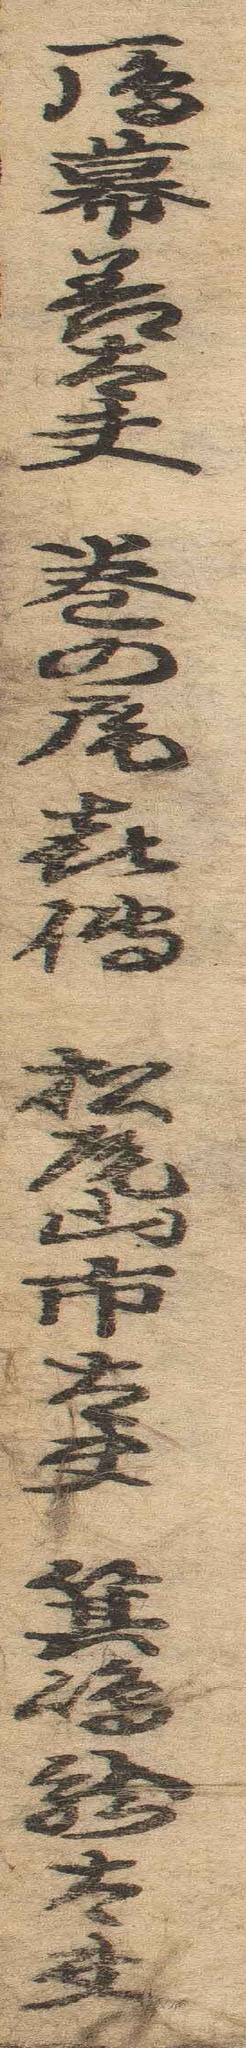鳫幕善太夫巻の尾喜伝松尾山市太夫箕嶋龍太夫

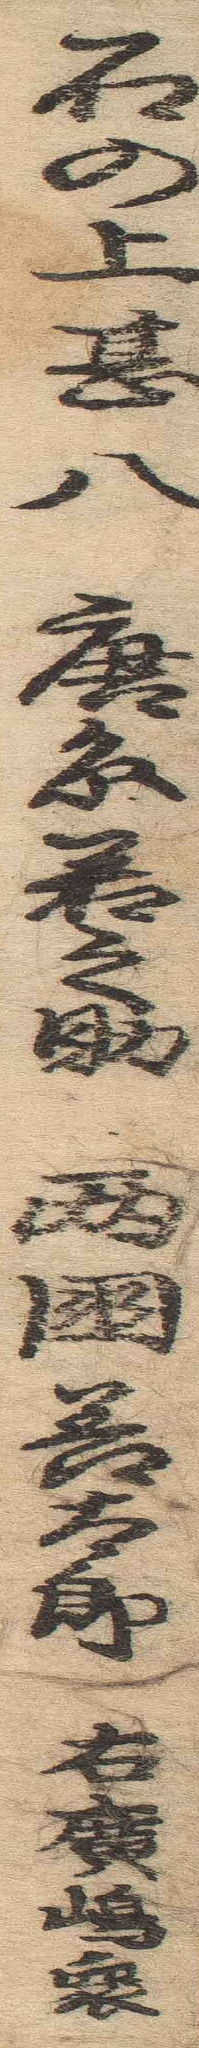石の上甚八廉糸若之助両國善太郎右広島衆
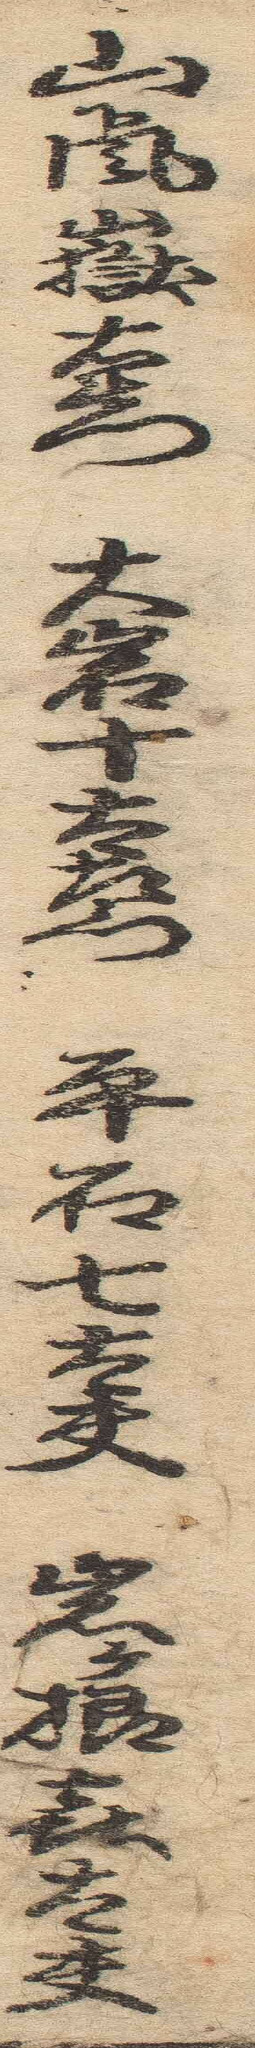山嵐嶽右衛門大岩十太左衛門平石七太夫岩ケ根喜太夫
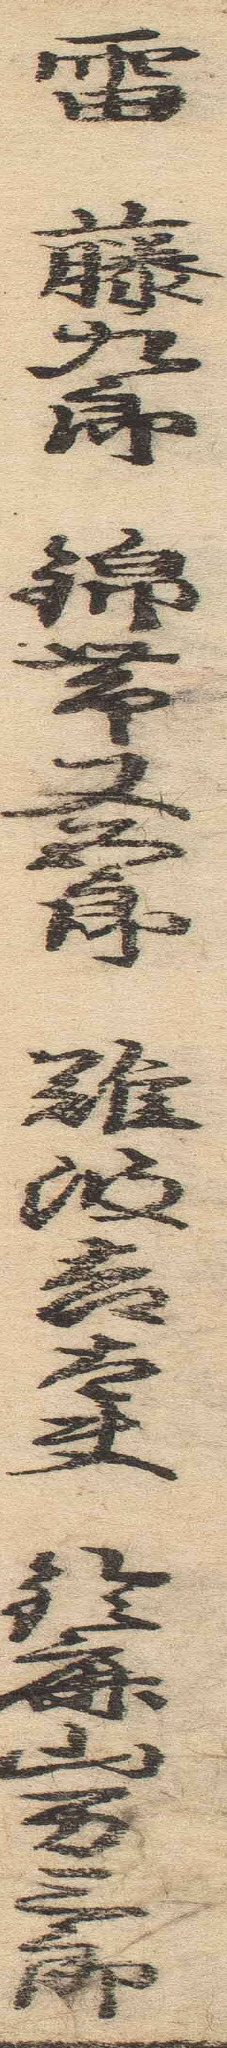雷藤九郎錦帯又五郎雄岐吉太夫鈴鹿山万三郎
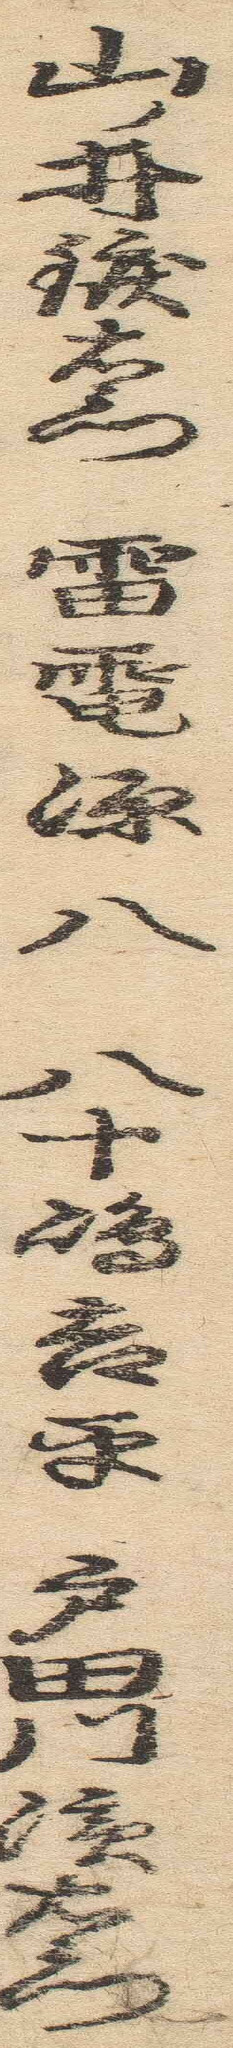山ノ井錑右衛門雷電源八八十嶋吉平戸田川浜右衛門
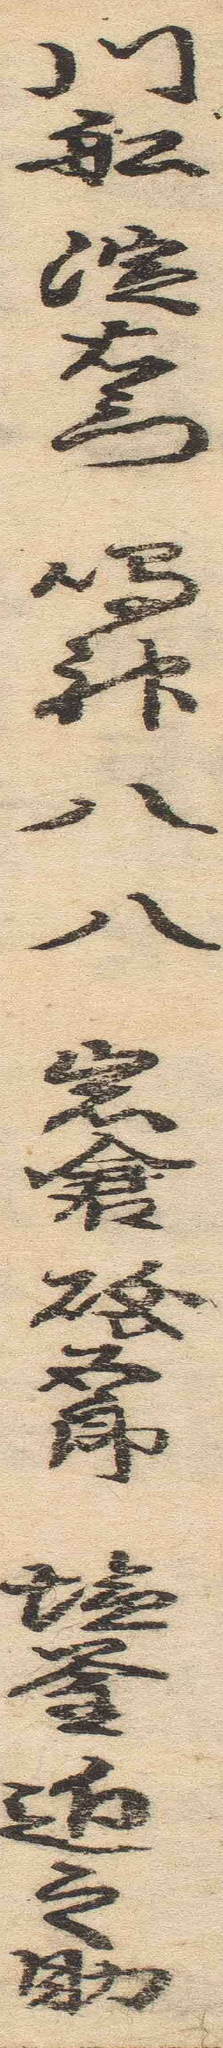川船浜右衛門鳴神八八岩倉磯五郎塩釜迎之助
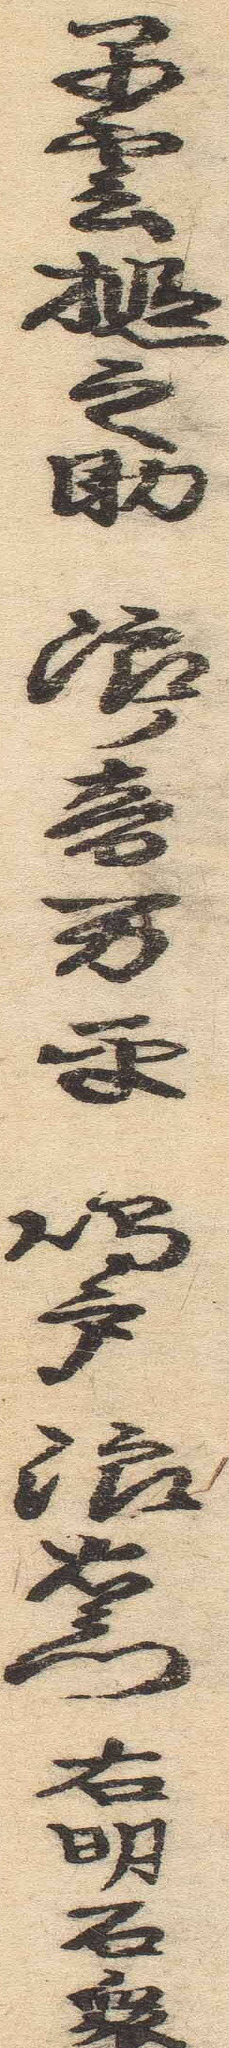早雲槌之助浪ノ音万平鳴門浪右衛門右明石衆
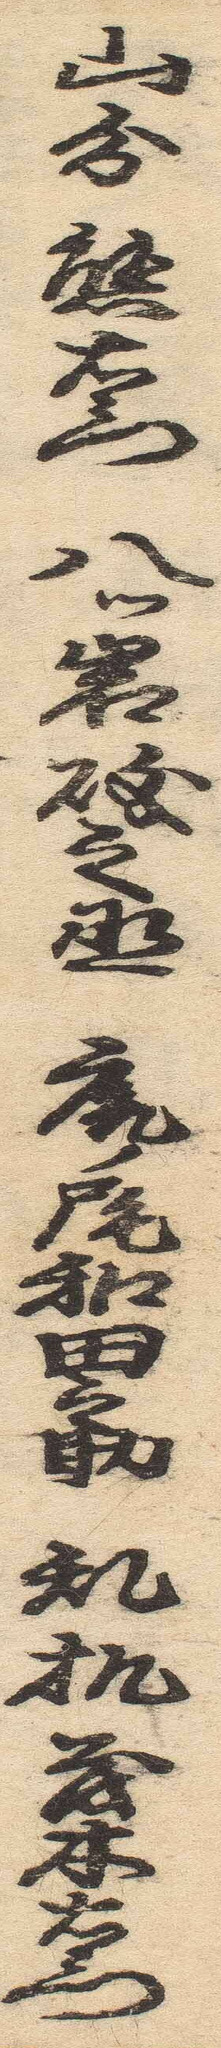山分熊右衛門八ッ岩磯之丞虎ノ尾和田之助礼机茂木右衛門
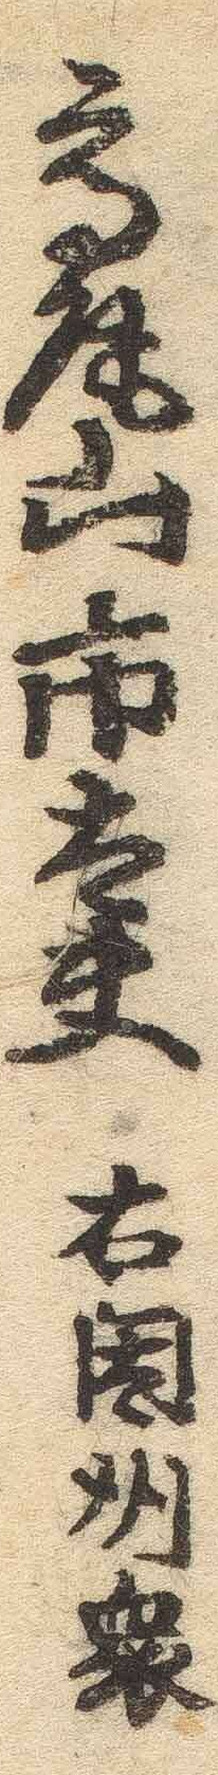高瓦山市太夫右因州衆
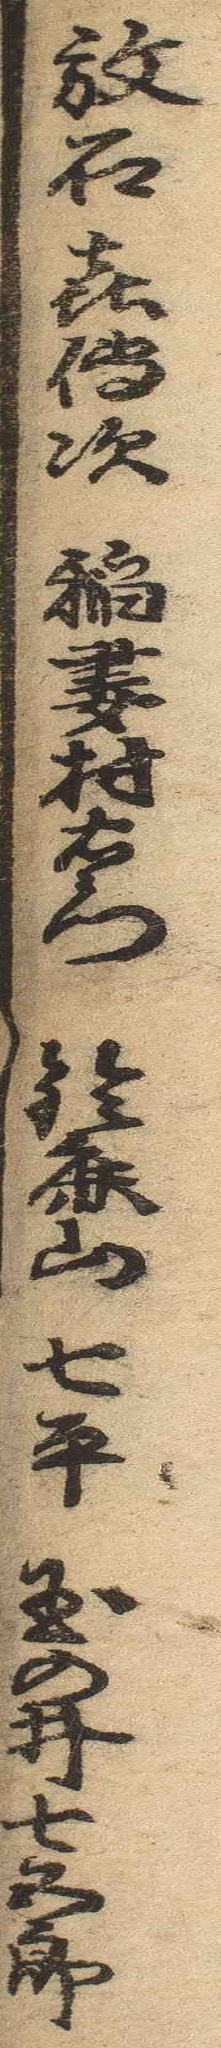放石喜伝次稲妻村右衛門鈴鹿山七平玉の井七五郎
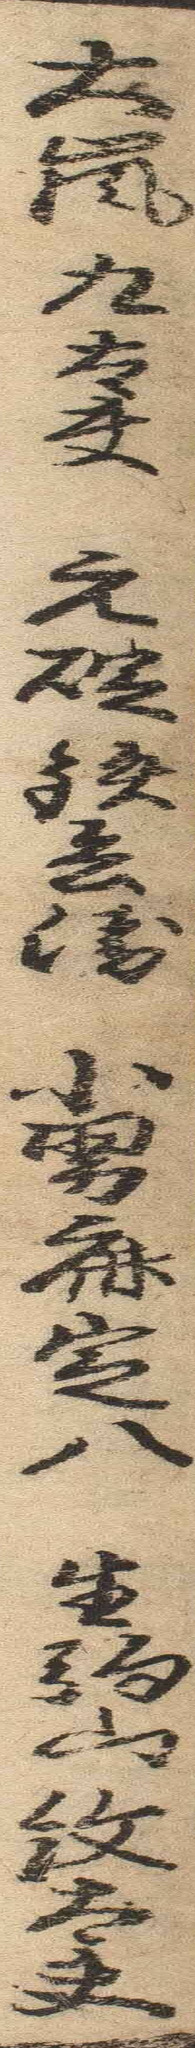大嵐九太夫元碇鉄兵衛小男鹿定八生駒山紋太夫
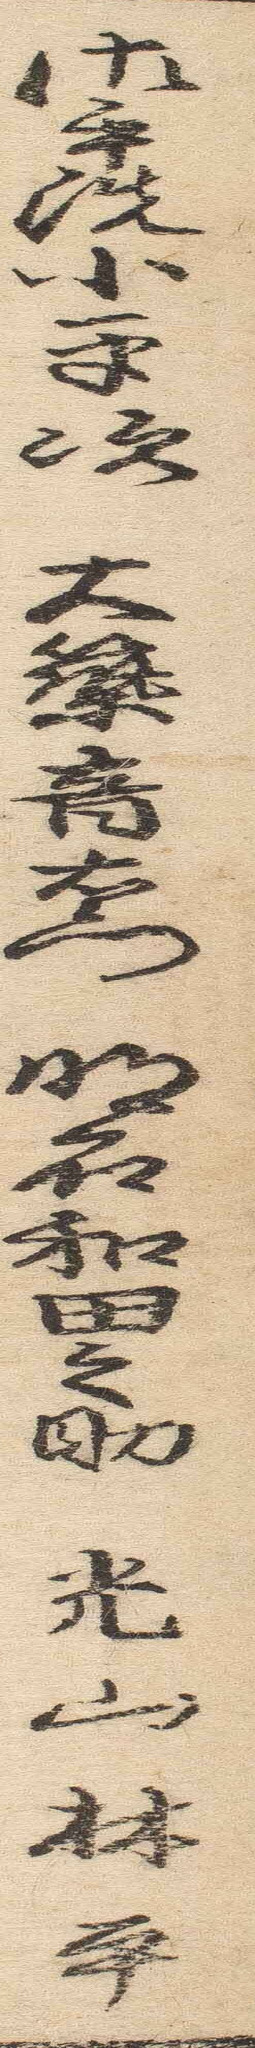御手洗小平次大築音右衛門明石和田之助光山林平
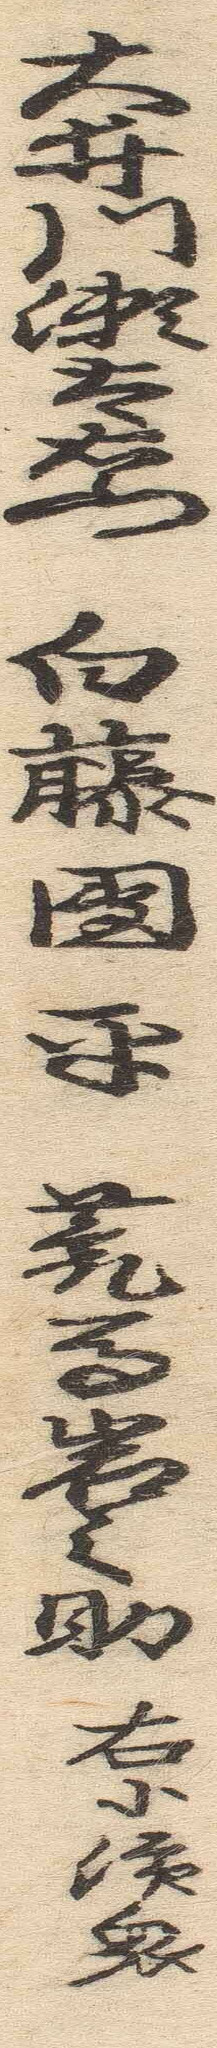大井川瀬太右衛門白藤団平荒馬岩之助右小浜衆
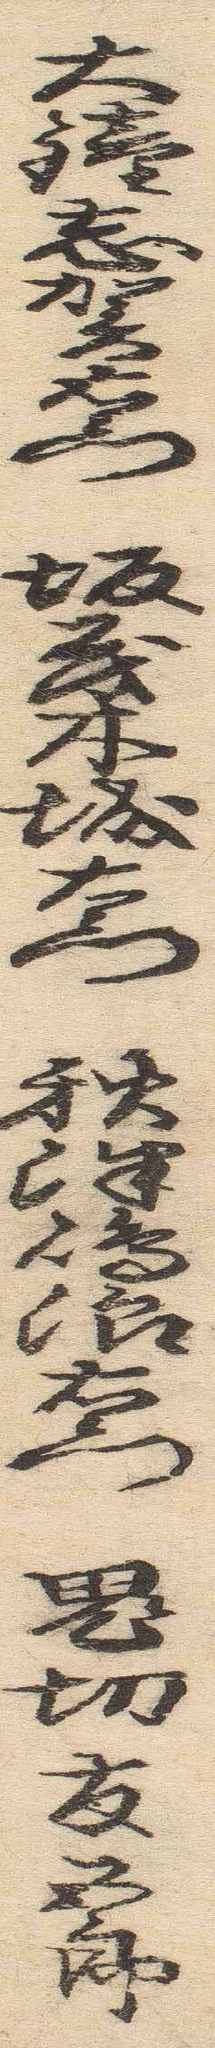大鏡志賀右衛門坂茂木城右衛門秋津嶋浪右衛門鬼切友五郎
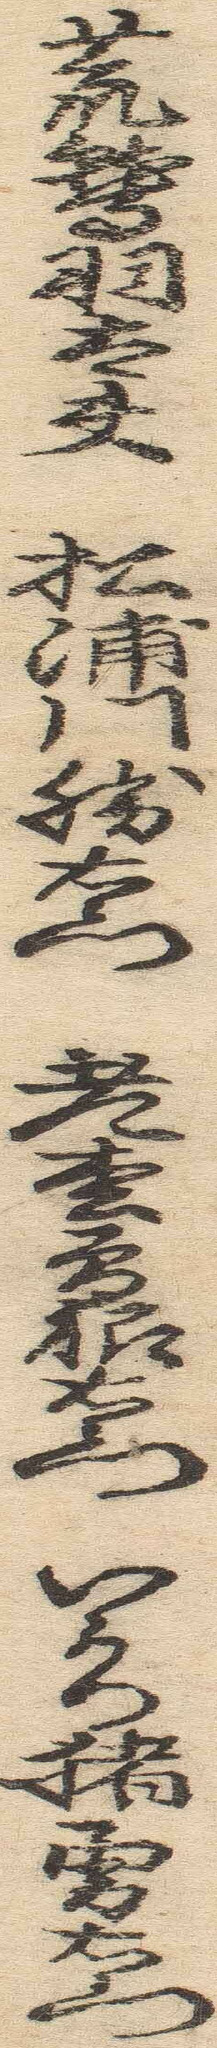荒鷲羽太夫松浦川勝右衛門老松曾根右衛門いかり猪勇右衛門
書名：古今相撲大全
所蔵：東京学芸大学附属図書館 国文学研究資料館
